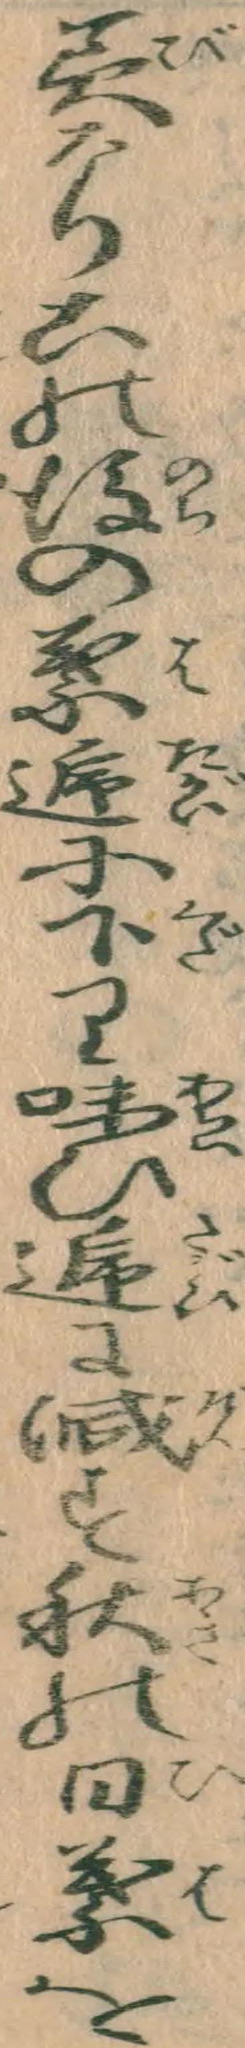美なりこの後の葉逓に下り味ひ逓に減す秋の日葉を
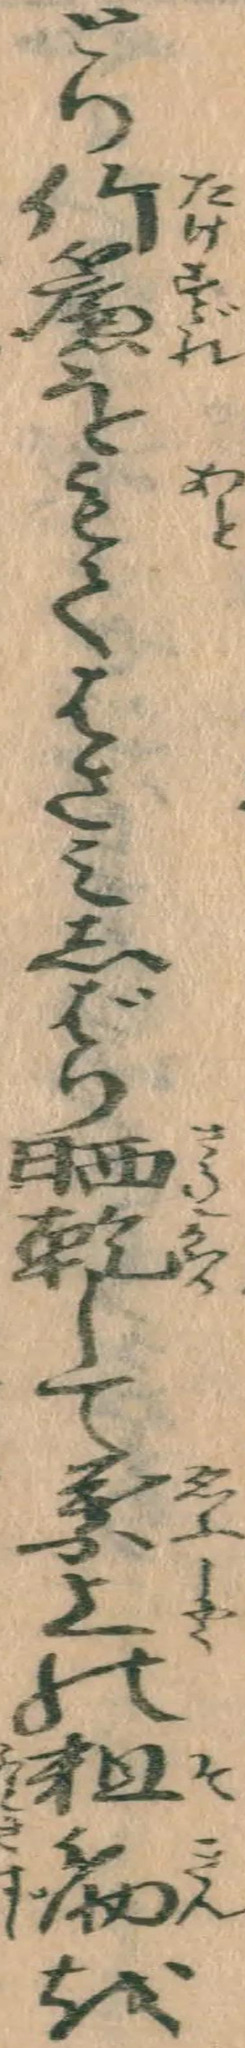とり竹簾をもてはさみしばり晒乾して葉上の粗筋を
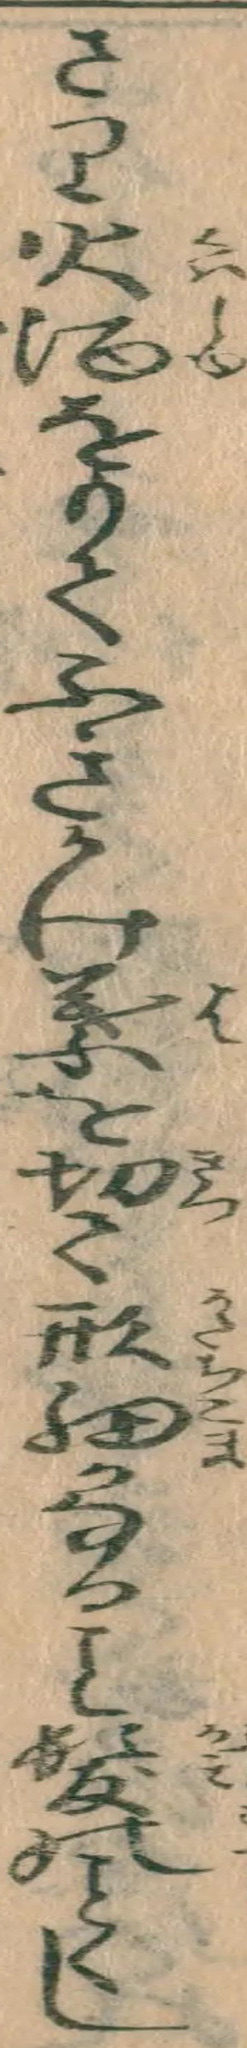さり火酒をもてふきかけ葉を切て形細かなること髪のことくし
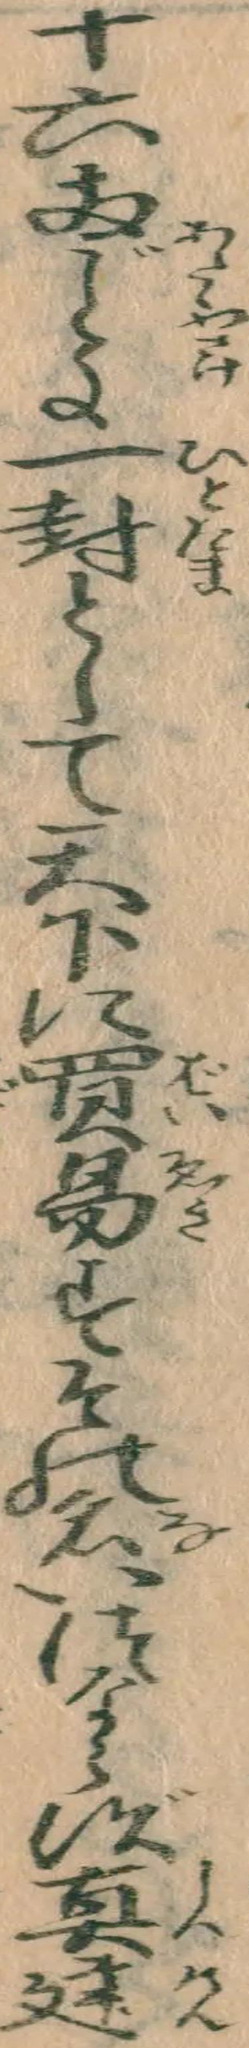十六両ごとに一封として天下に買易すその名いつならず真建
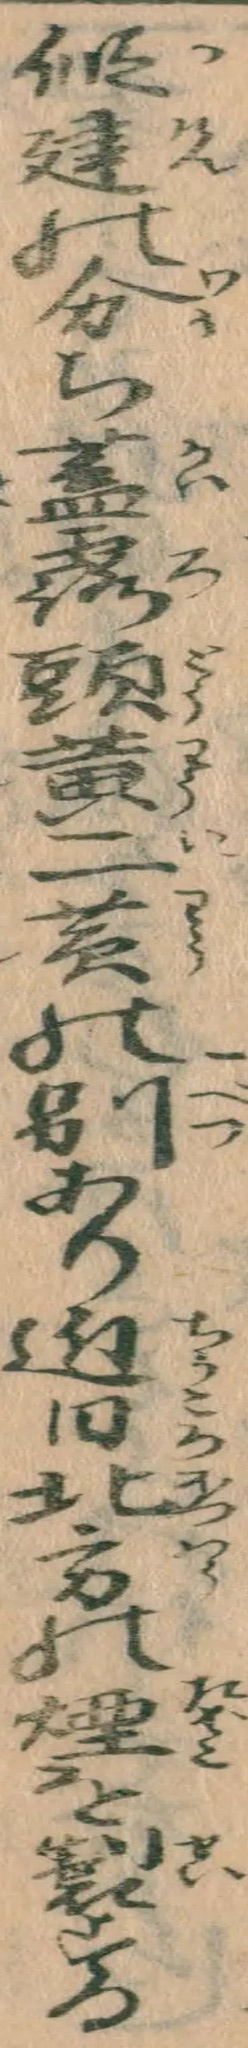仮建の分ち蓋露頭黄二黄の別あり近日北方の煙を製する
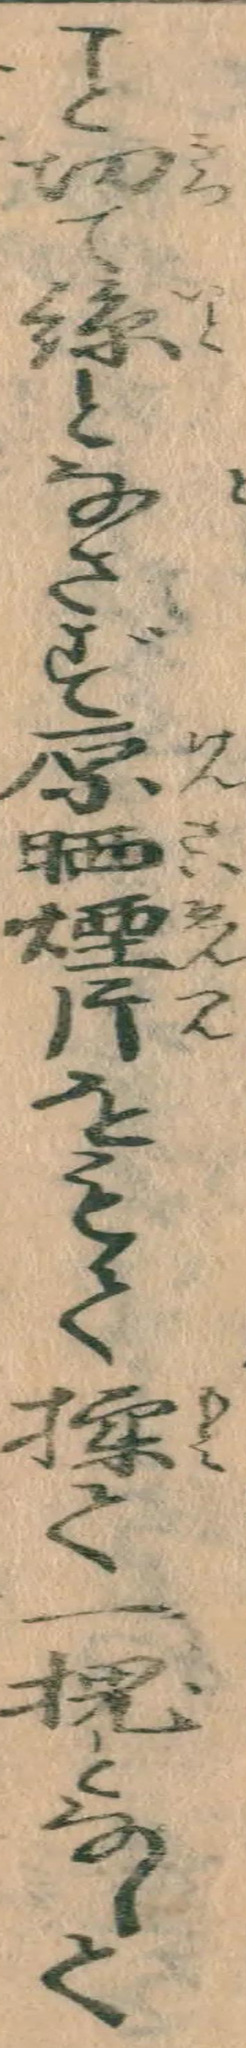こと切て糸となさず原晒煙片をもて揉て一塊となして
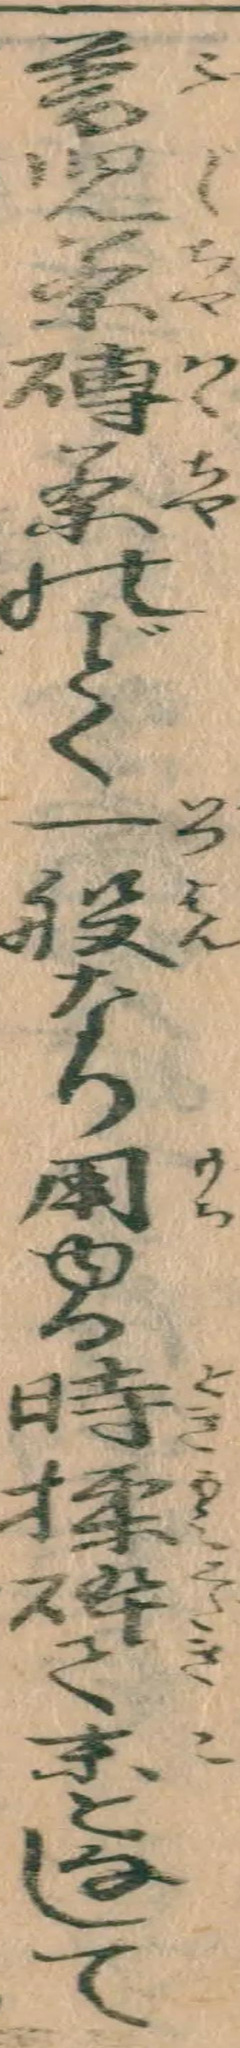普児茶磚茶のごとく一般なり用ゆる時揉砕て末となして
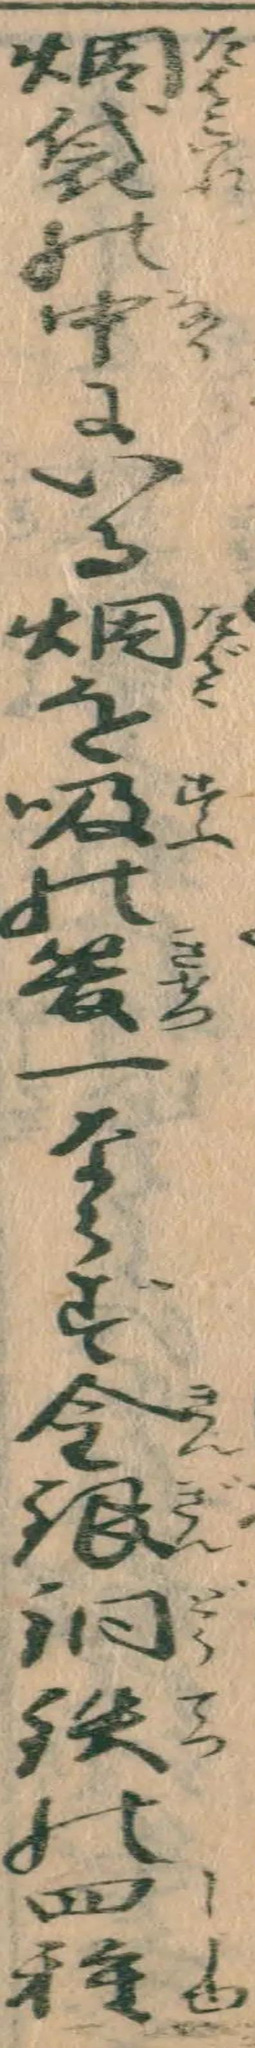烟袋の中にいる烟を吸の管一ならず金銀銅鉄の四種
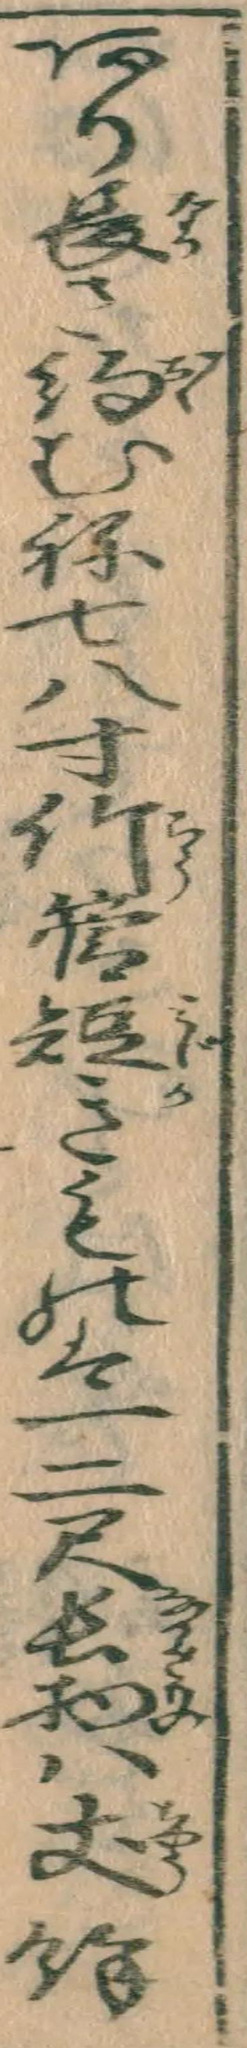あり長さ約むね七八寸竹管短きものは一二尺長物は丈余
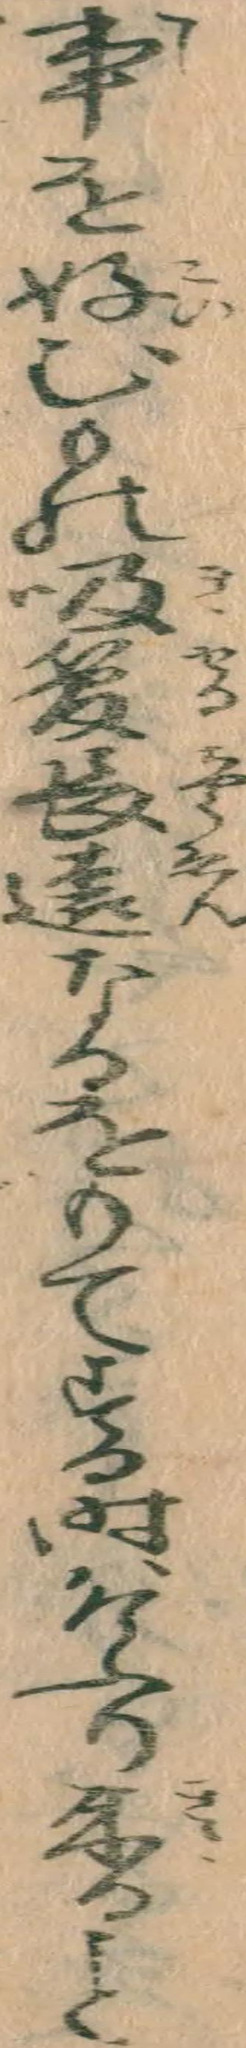事を好むもの吸管長遠なるをもてする時はけふり来ること
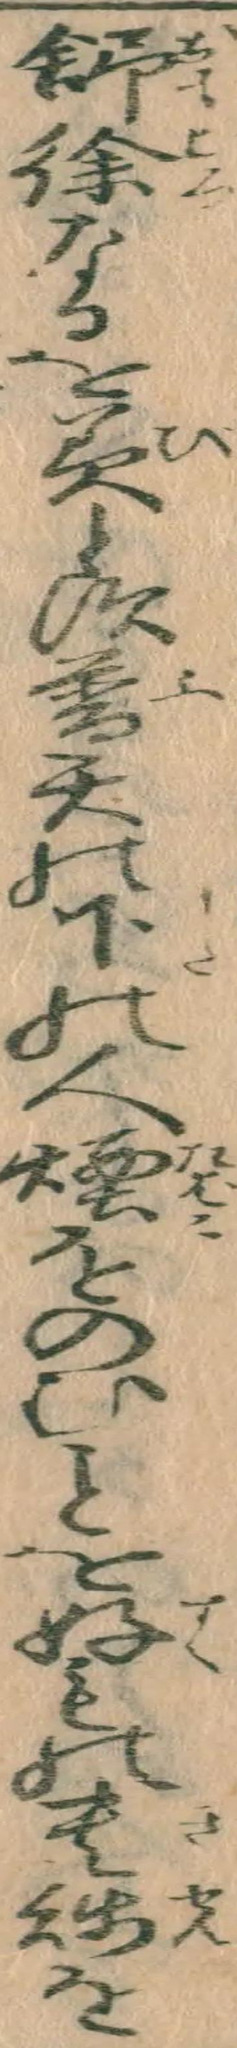舒徐なるを美とす普天の下の人煙をのむことを好もの貴賎を
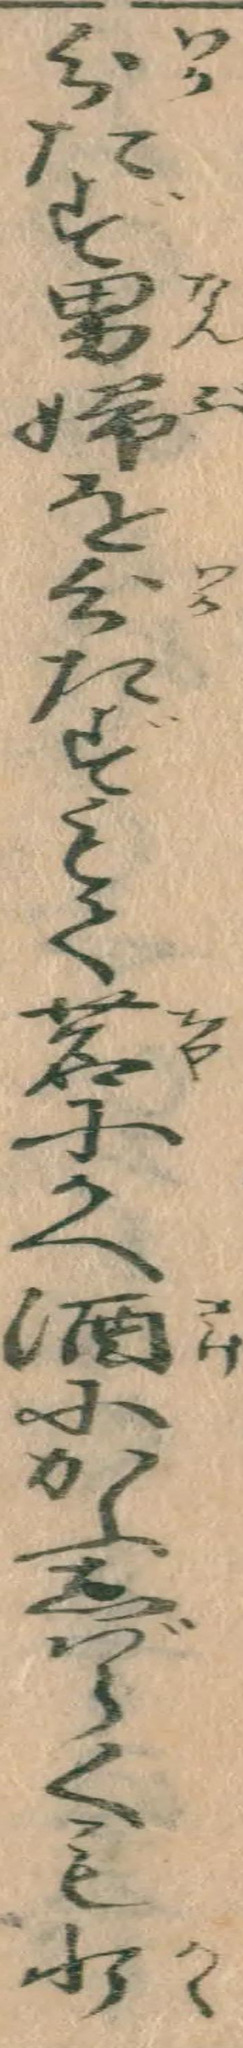分たず男婦を分たずもて茗にかへ酒にかふしばらくも少
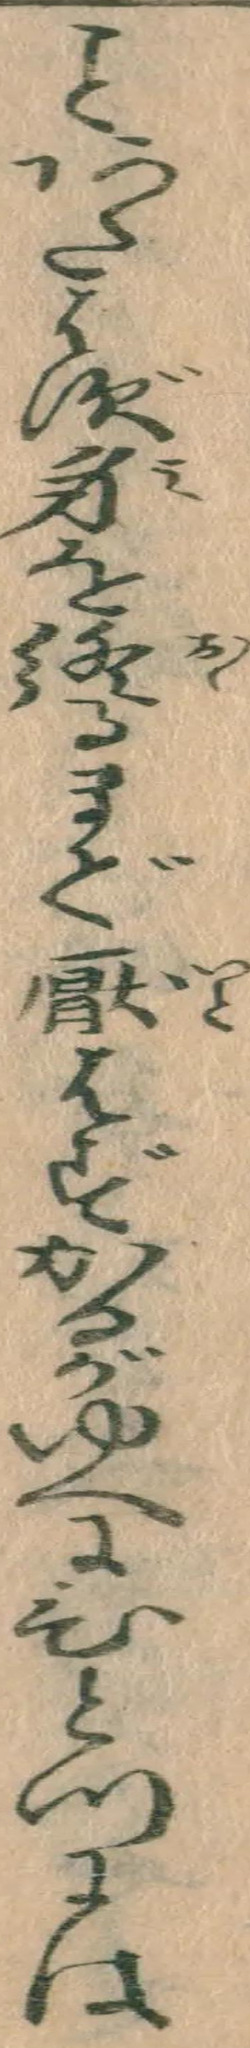ことあたはず身を終るまで厭はずかるがゆへにひとつには
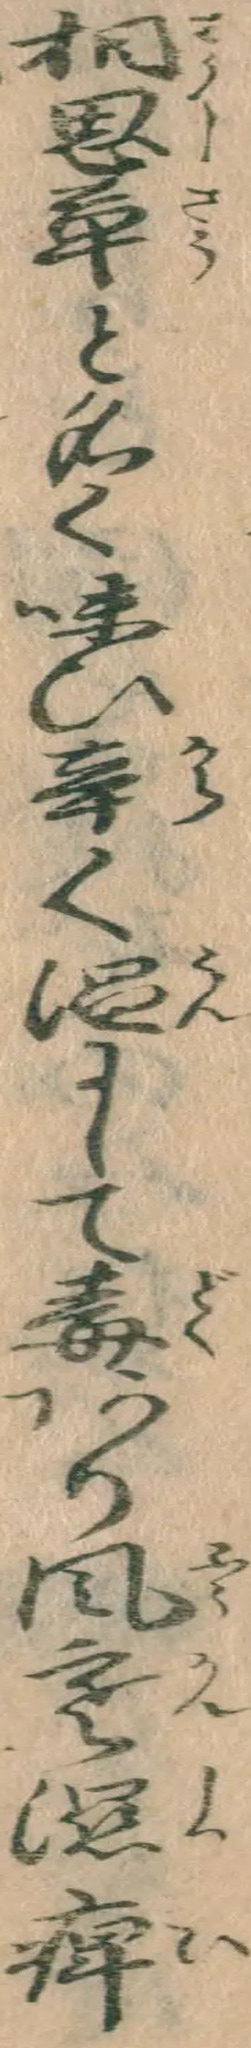相思草と名く味ひ辛く温にして毒あり風寒湿痺
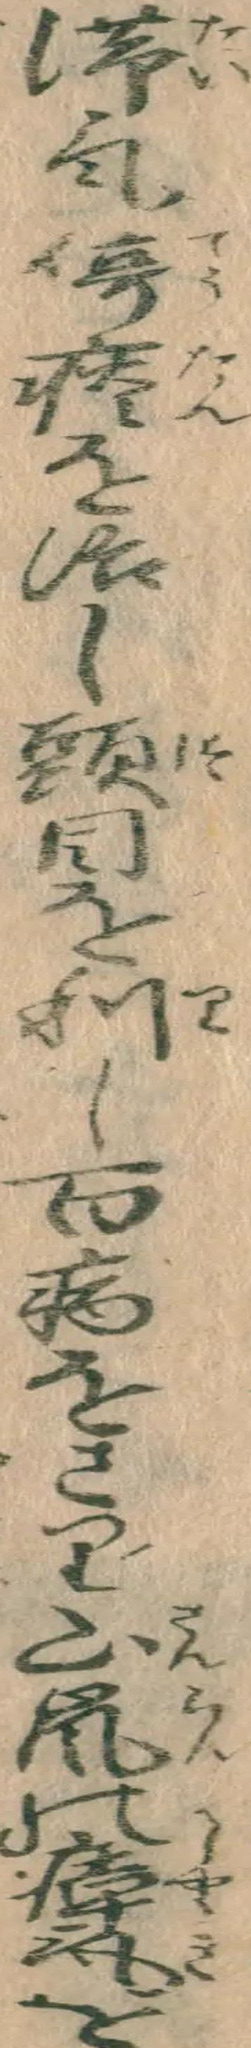滞気停痰を治し頭目を利し百病をさり山嵐の瘴気を
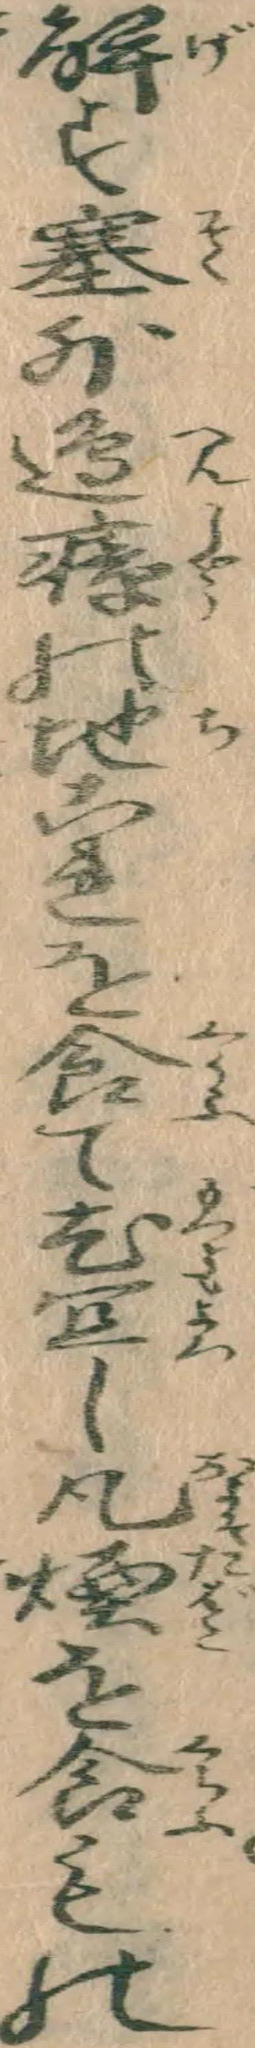解す塞外辺瘴の地これを食て尤宜し凡煙を食もの
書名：煙草記
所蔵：国立国会図書館 National Diet Library, JAPAN
